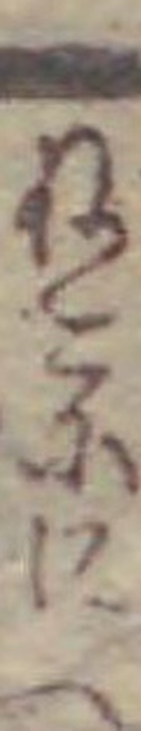ねこにに
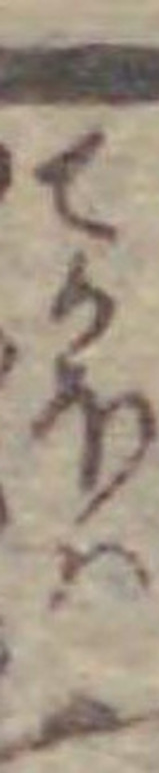てかほは
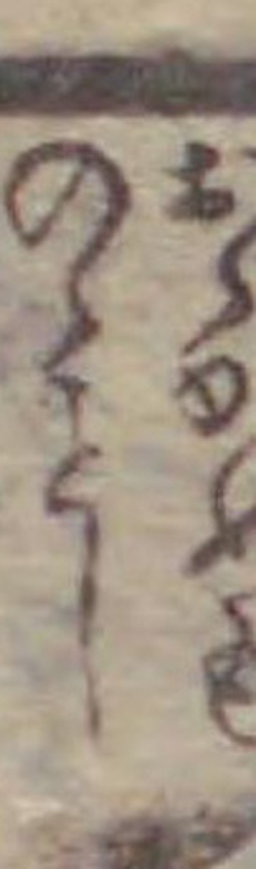のゝことし
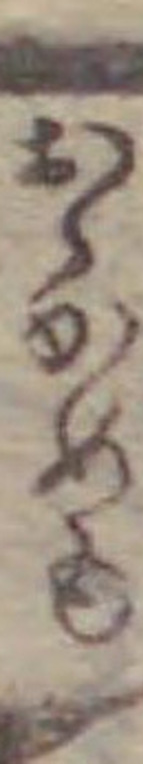おゝかめも
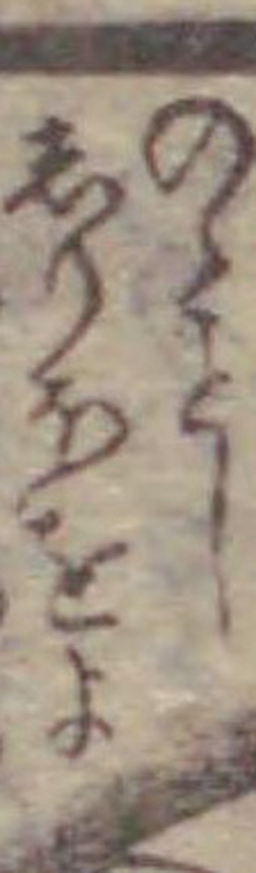しりほをよ
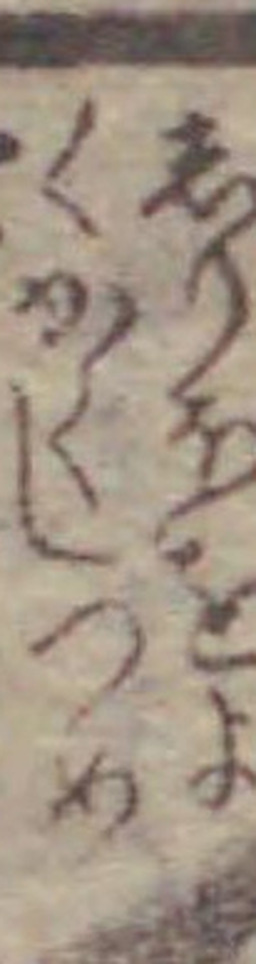くかくしつめ
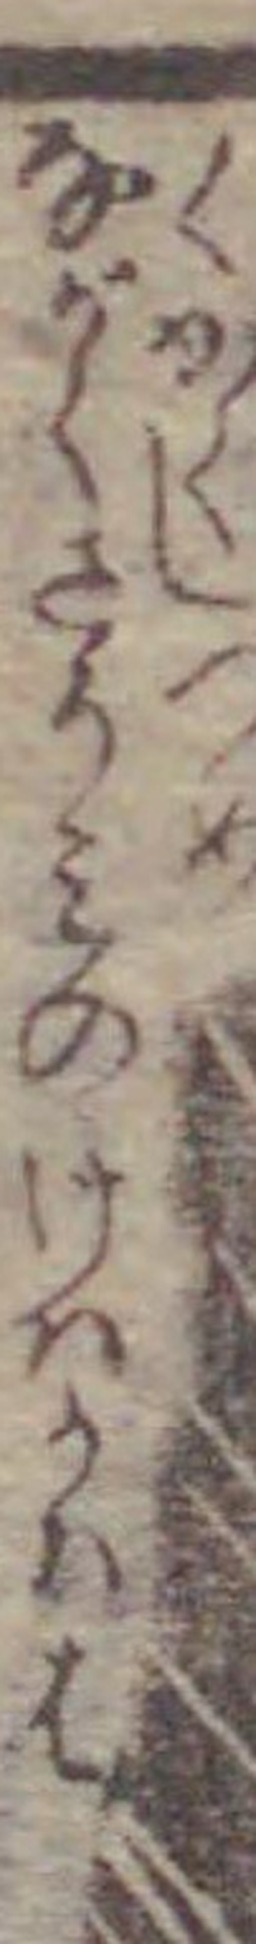ながくさうみのけはかはは
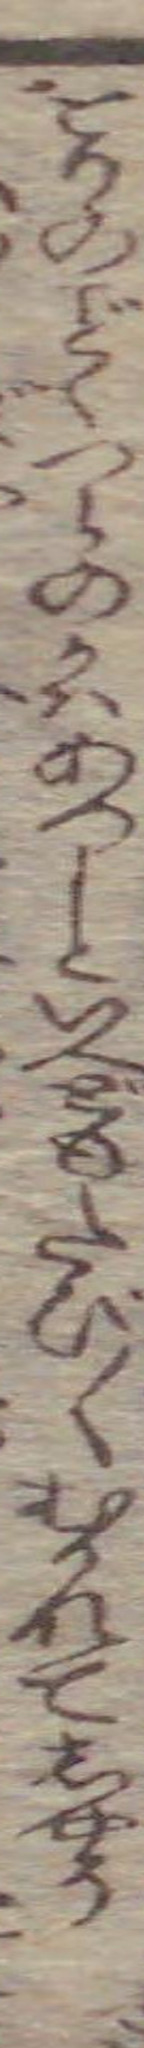をりのごとくつらのかはあつしといへどもたび〳〵むかれてしやう
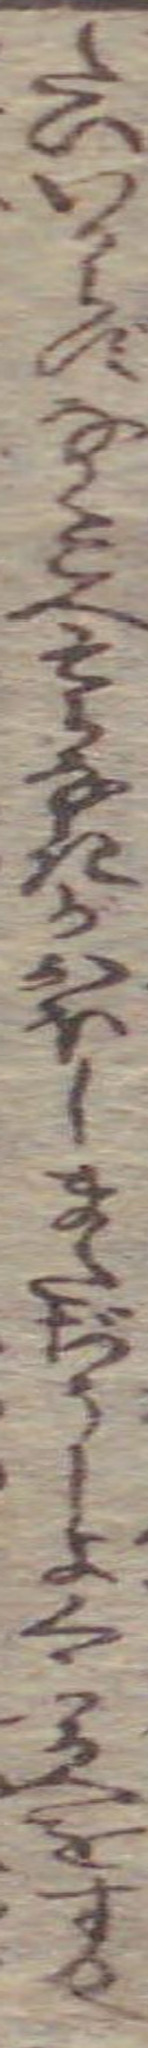たいわからずなくこへそらなきかおほしまたぢうしよくかへをする
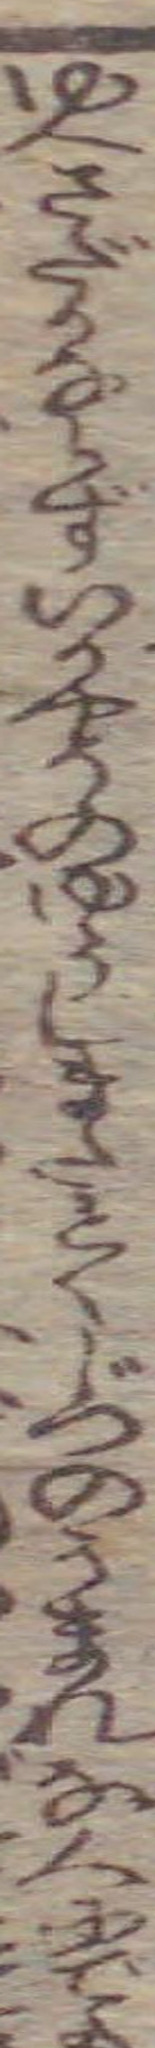ゆへさだかならずいかやうのゆうしまたとくじつのうまれな人にても
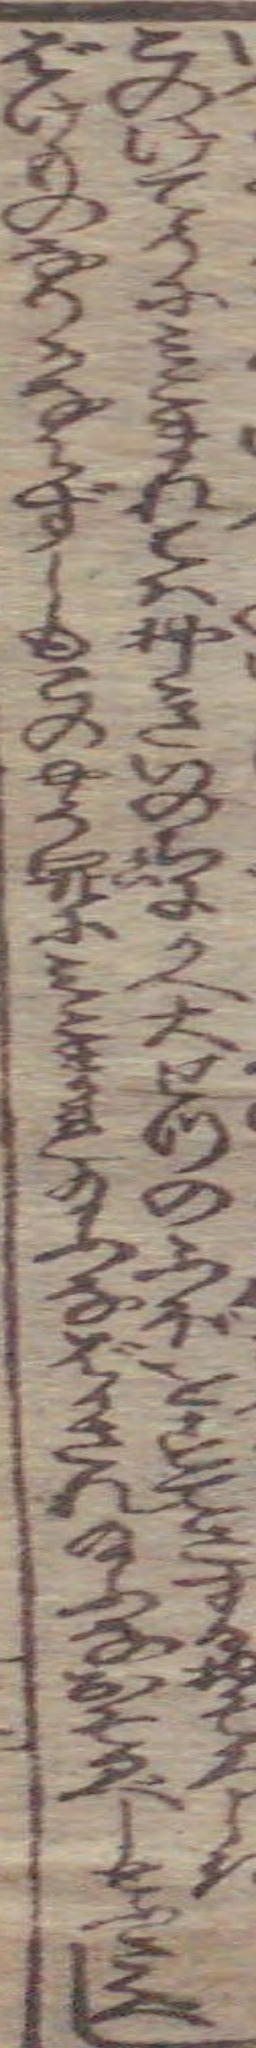ばけものなりかならずしもこのやう開にみこまれ給ふなばかさん給ふなおそるべしとふさくべし

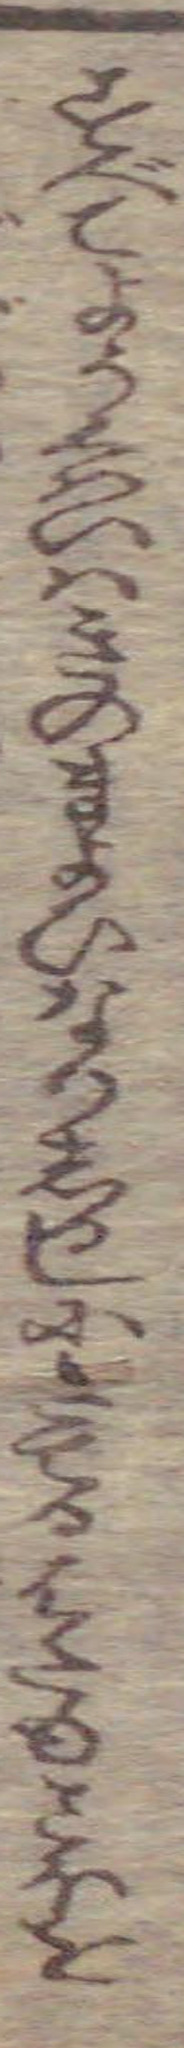すべてようくはいはきのまよひなりしるしにたてるはたもさほを
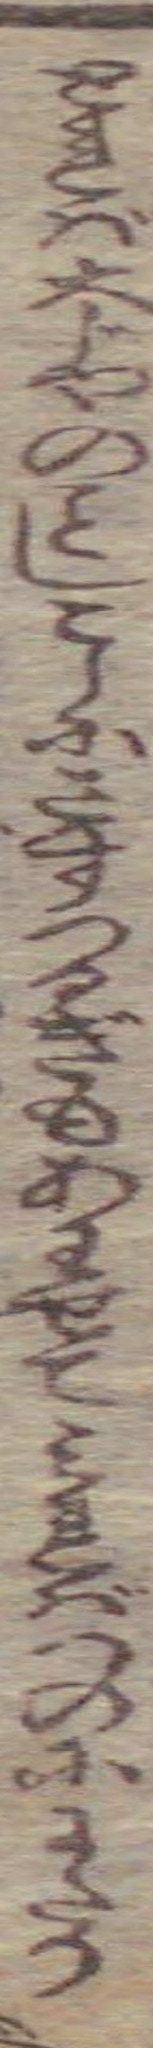とれば大じやのことしこしにさすつるぎもあわせてみればつのににたり
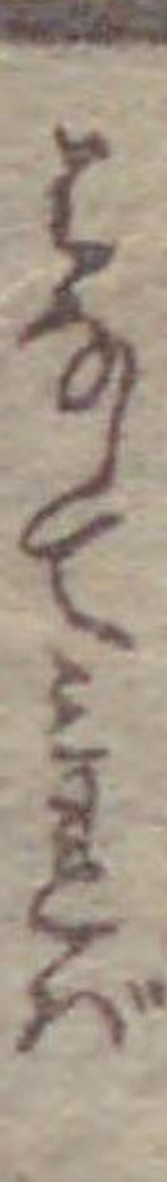はなしてみれば
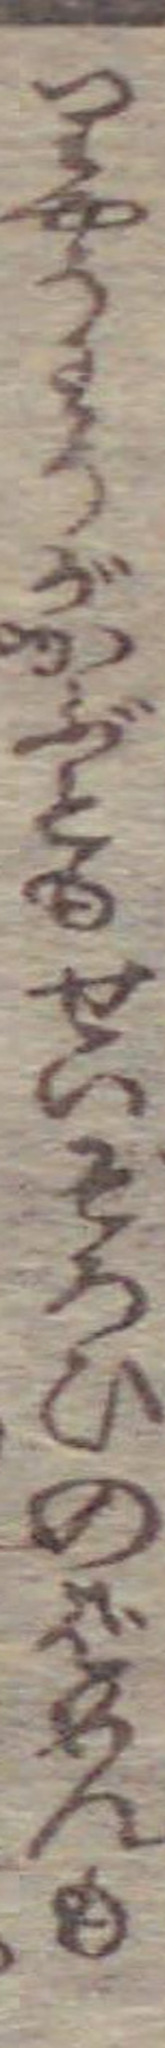りやうわうがかぶともせいぞろひのばめんも
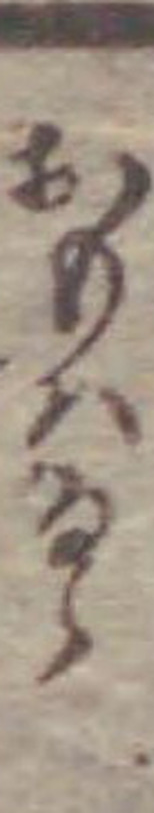おもはるゝ
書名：武家物奇談 : 3巻
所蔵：国立国会図書館 National Diet Library, JAPAN
